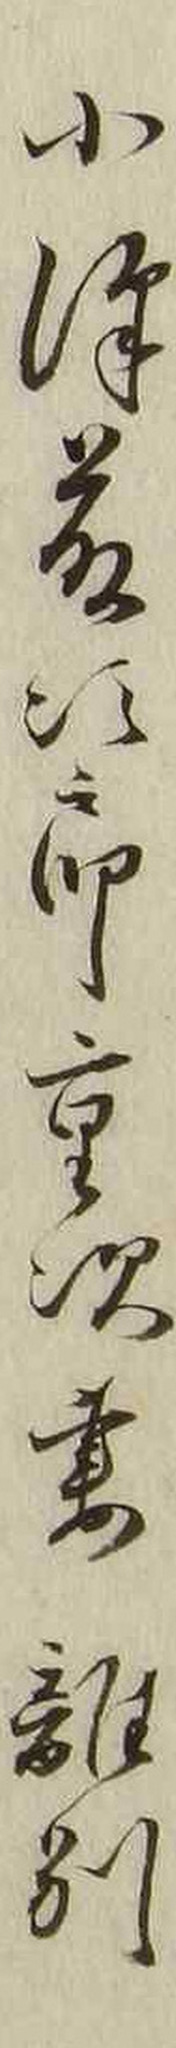小澤藤次郎重次妻離別
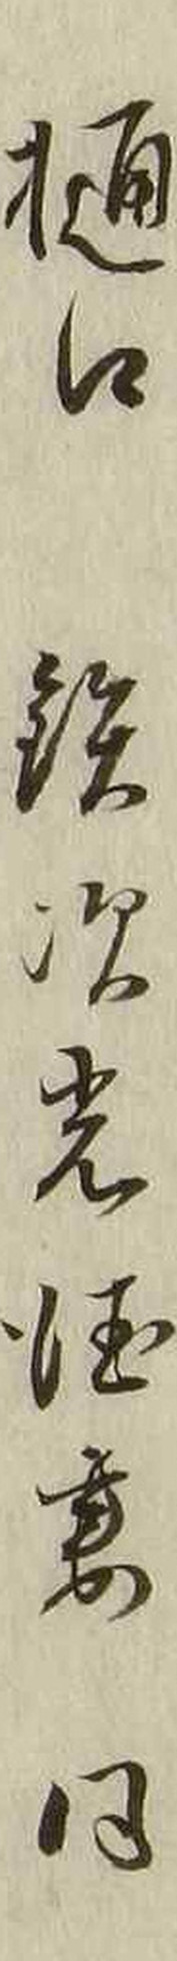女樋口鉄次光徳妻同
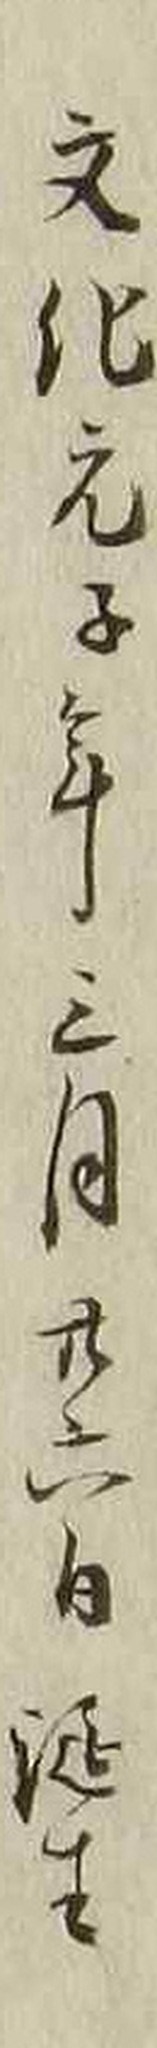文化元子年三月廿六日誕生
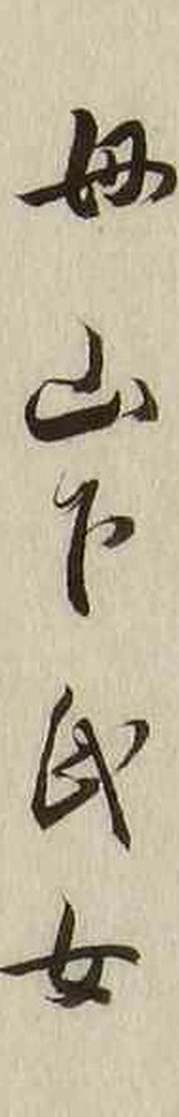母山下氏女
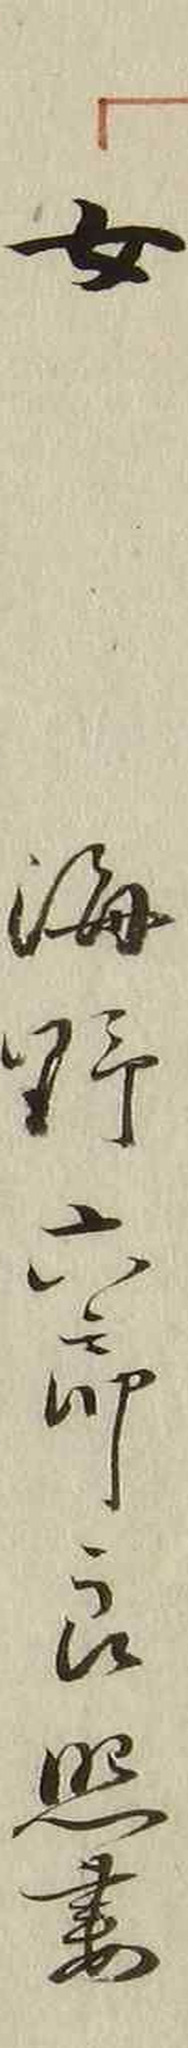女海野六郎良照妻
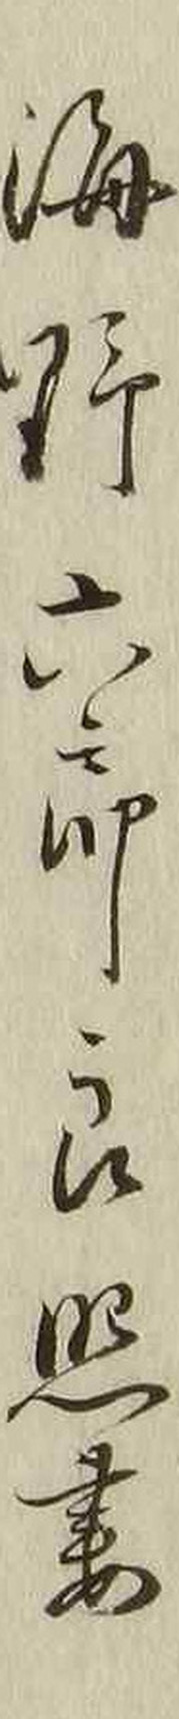女海野六郎良照妻
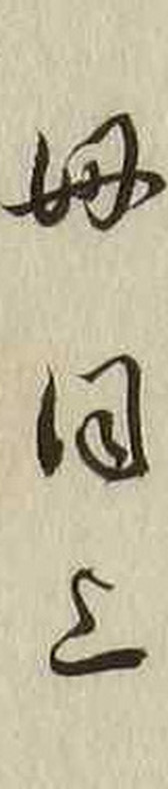母同上
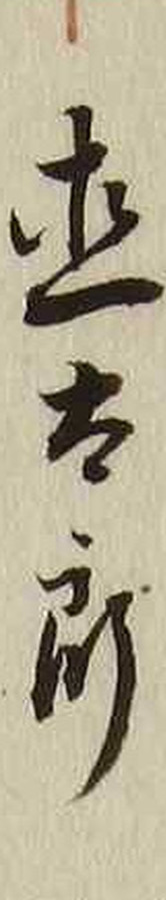直太郎
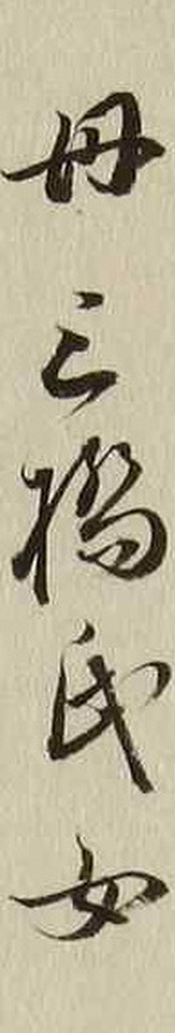母三橋氏女
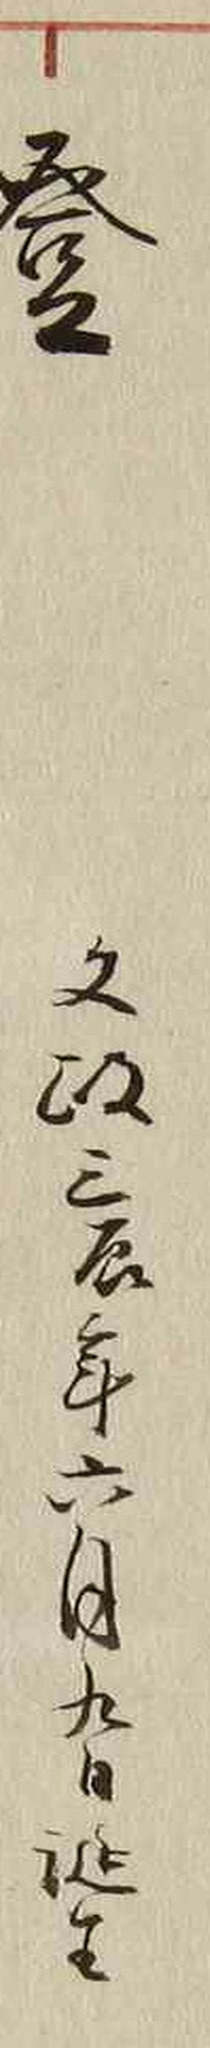登文政三辰年六月九日誕生
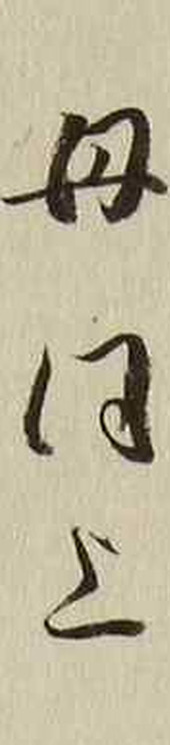母同上
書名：諸士系譜　巻之26　い之部26
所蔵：会津若松市立会津図書館
